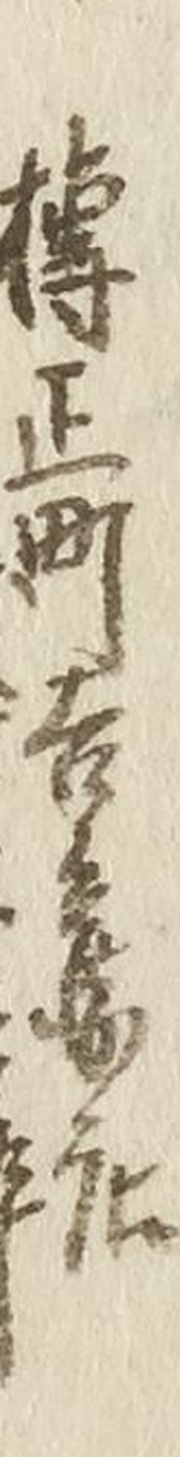榑正町吉兵衛庄
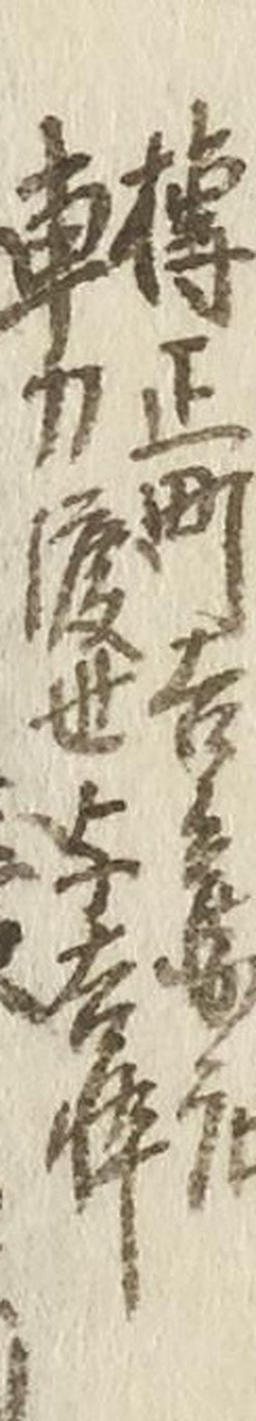車力渡世与吉忰
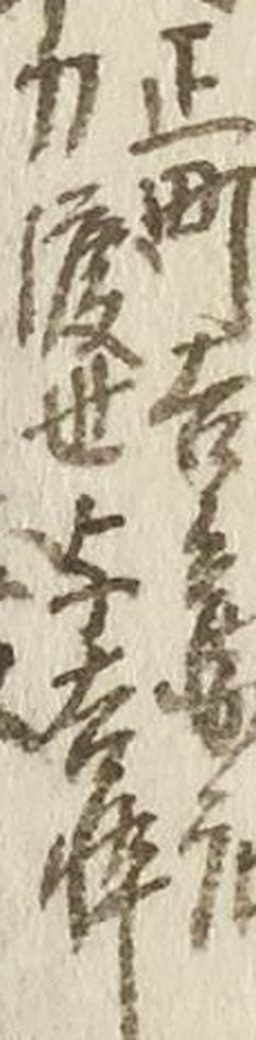車力渡世与吉忰
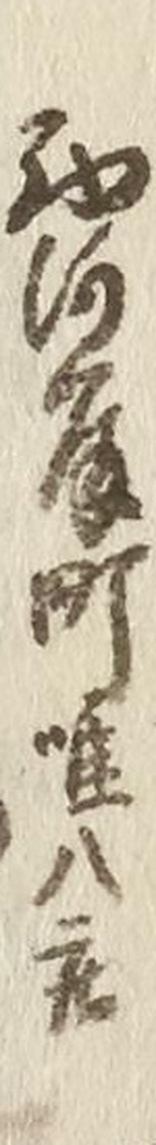西河岸町唯八庄
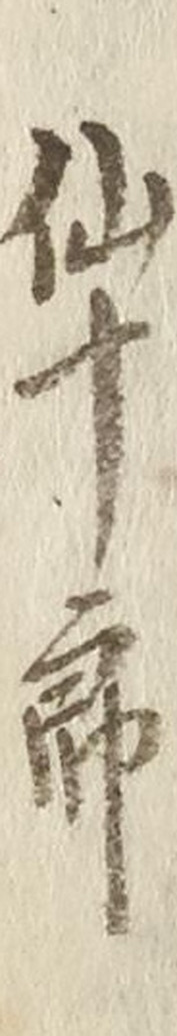仙十郎
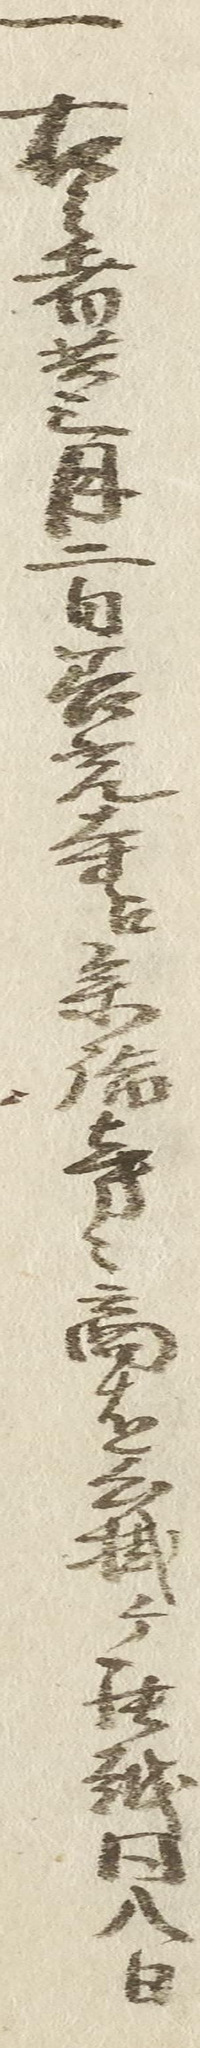一右之者共三月二日善光寺江参詣旁ニ商を心掛ケ罷越同八日
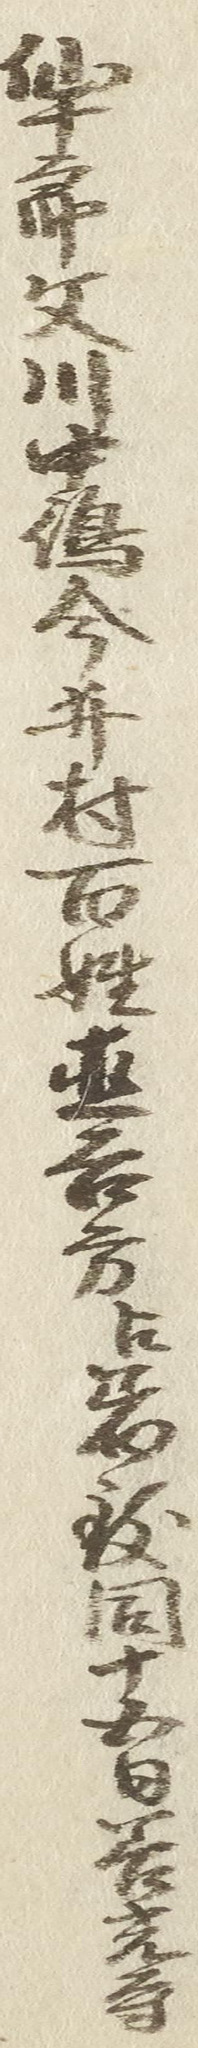仙十郎父川中嶋今井村百姓直吉方江着致同十五日善光寺
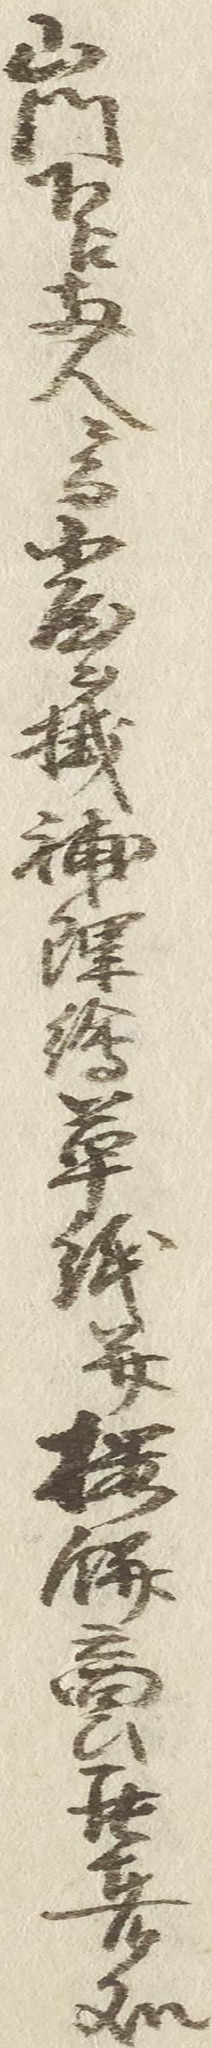山門下江両人ニ而小屋ヲ掛絵草子并桜餅商ひ罷在候処
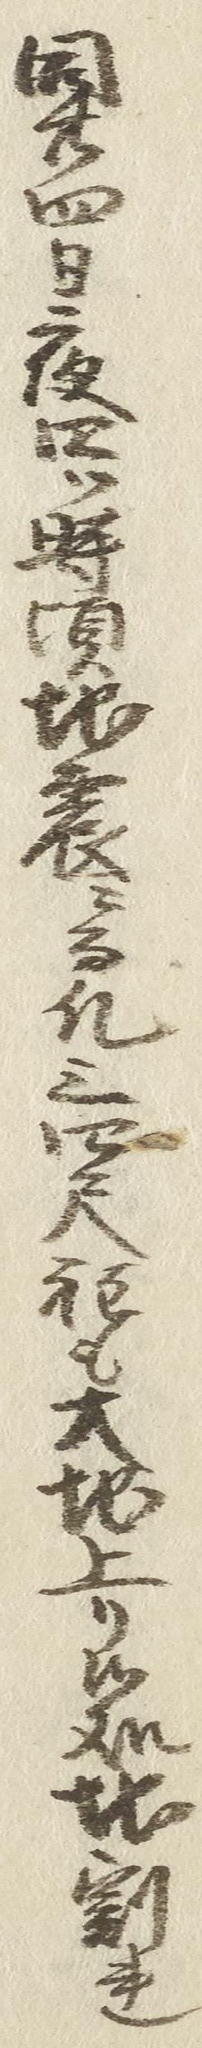同廿四日夜四ツ時頃地震ニ而凡三四尺程も大地上り候処地割れ
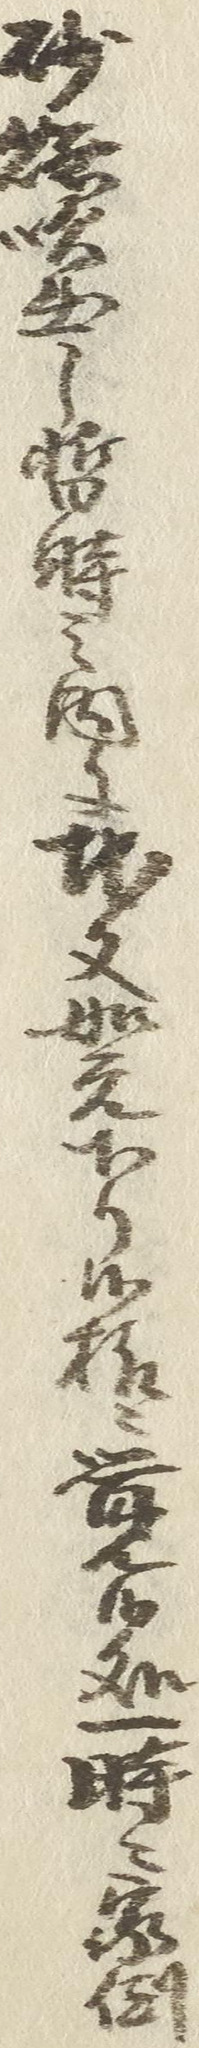砂煙吹出し暫時之内に地又如元下り候様ニ覚候処一時ニ家倒
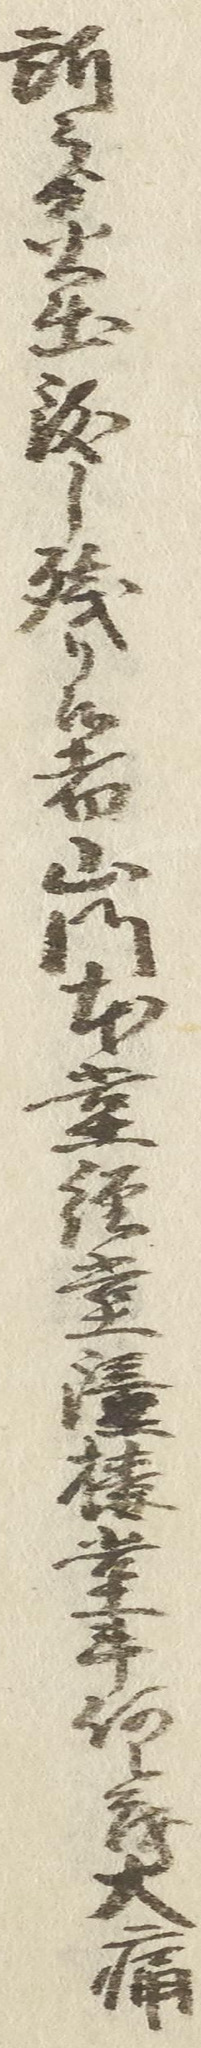所々ゟ火出致し残り候者山門本堂経堂鐘楼堂何レも大痛
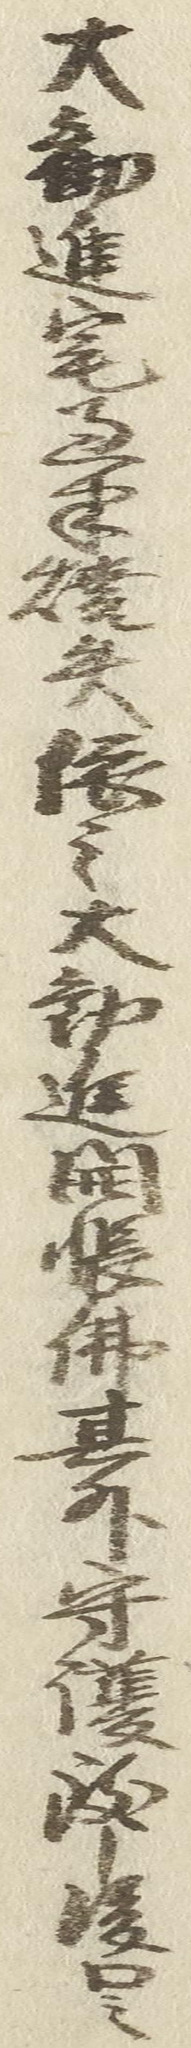大勧進宅過半焼失依之大勧進開帳仏其外守護致し後口之

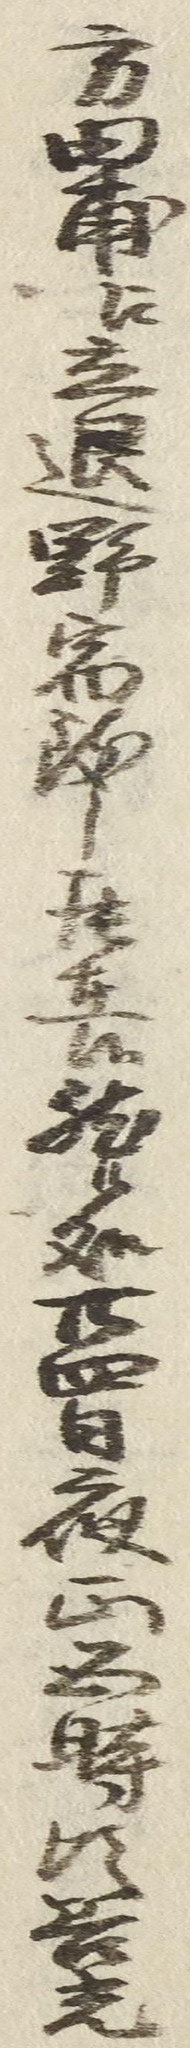方田甫江立退野宿致し罷在候然ル処廿四日夜正五時頃善光
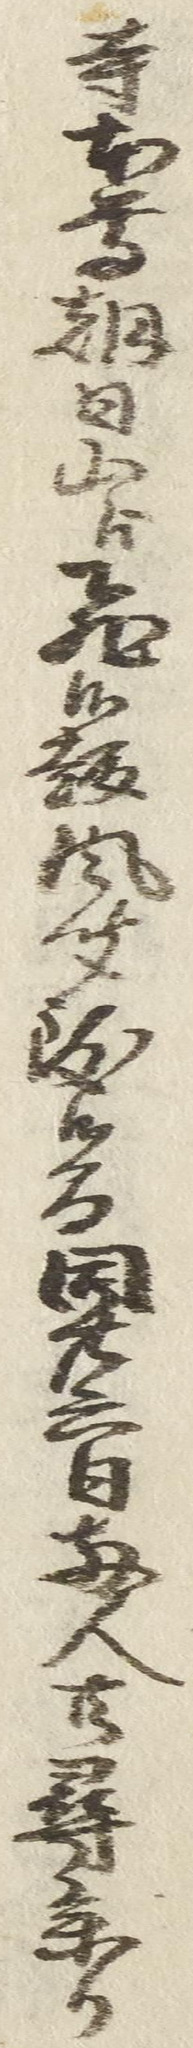寺本尊朝日山江飛候趣風聞致候間同廿六日両人共尋参り
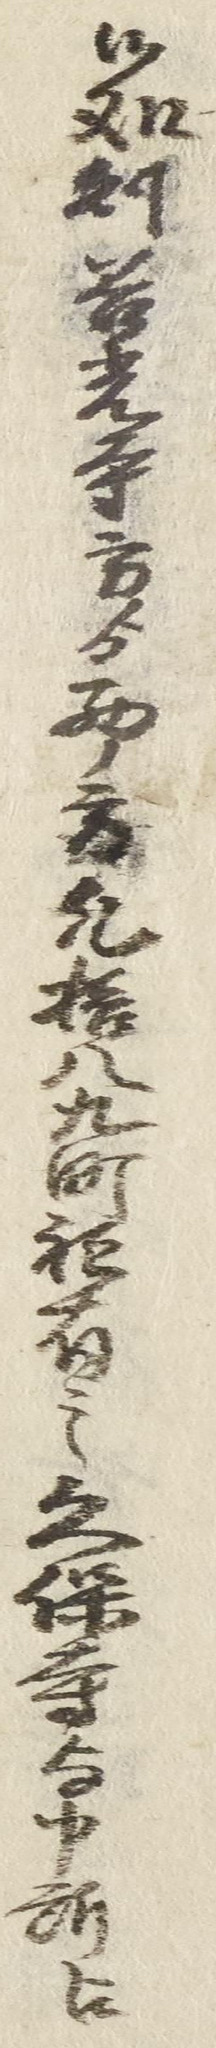候処則善光寺方ゟ西ノ方凡拾八九町程有之久保寺与申所江
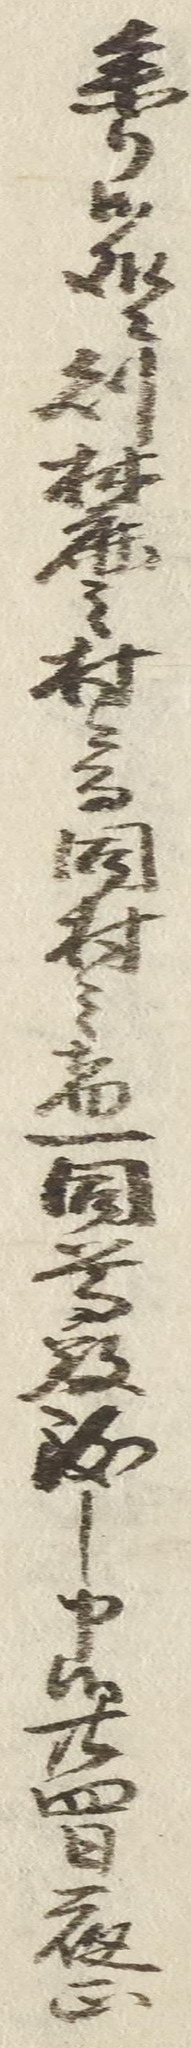参り候処ニ則麓之村ニ而同村之者一同尊敬致し申候廿四日夜正
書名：従往古地震御届書記誌之一
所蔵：東京大学地震研究所図書室 Earthquake Research Institute Library, The University of Tokyo, JAPAN
